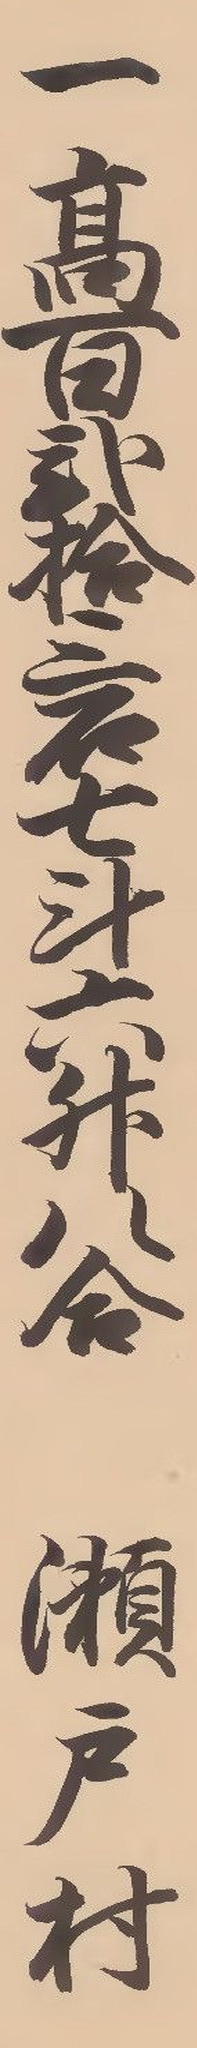一高百弐拾三石七斗六升八合瀬戸村
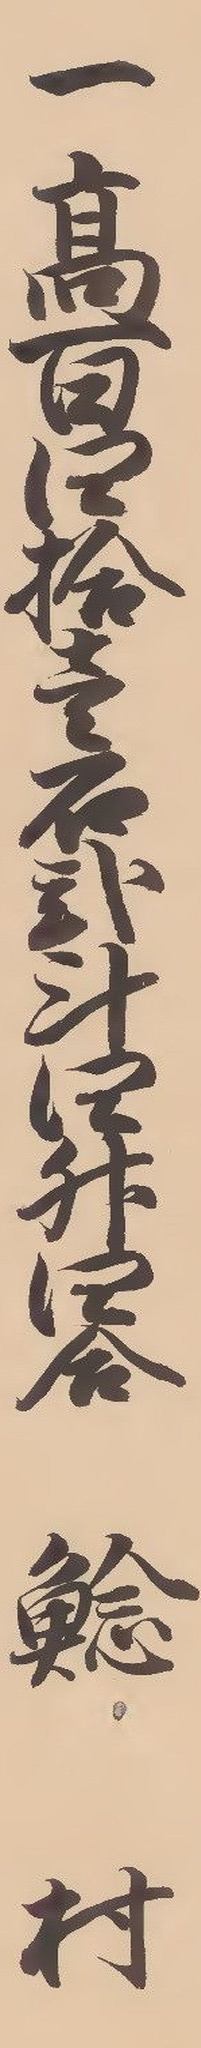一高百四拾壱石弐斗四升四合鯰村
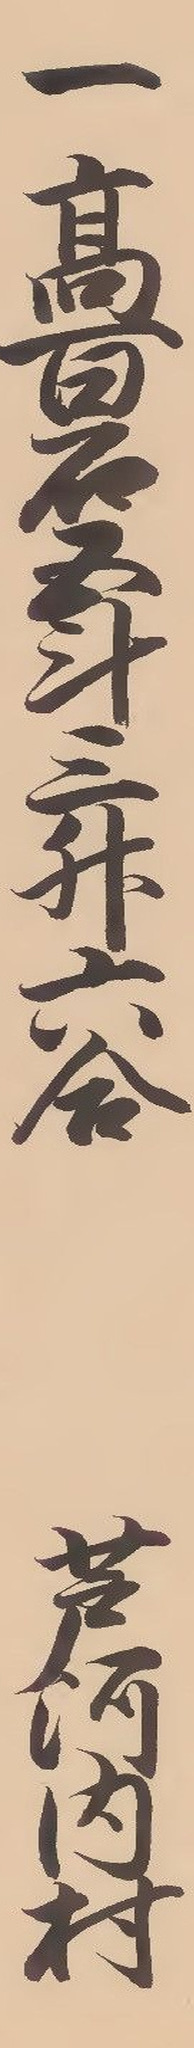一高百石五斗三升六合芦河内村
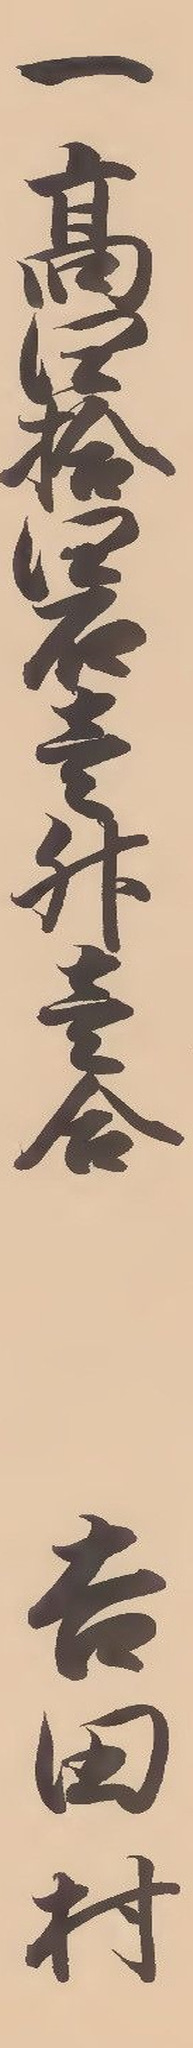一高四拾四石壱升壱合吉田村
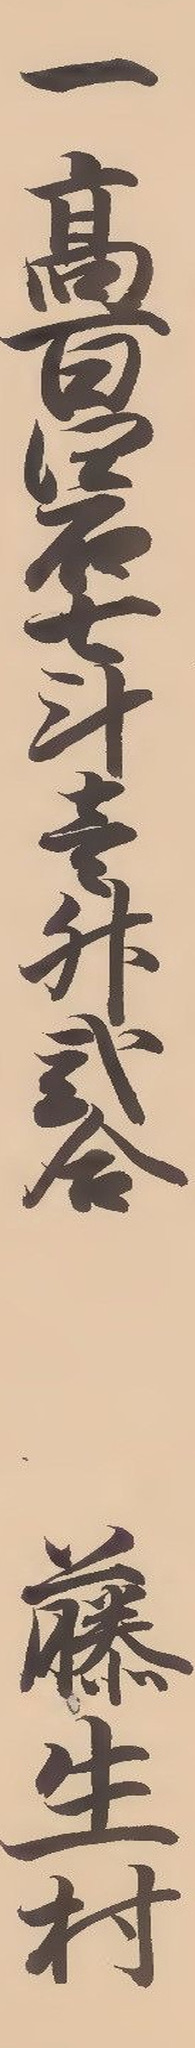一高百四石七斗壱升弐合藤生村
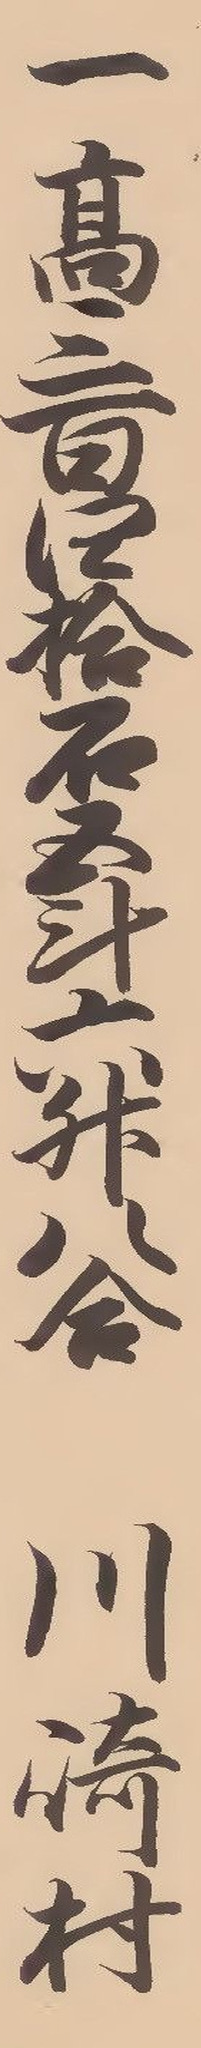一高三百四拾石五斗六升八合川崎村
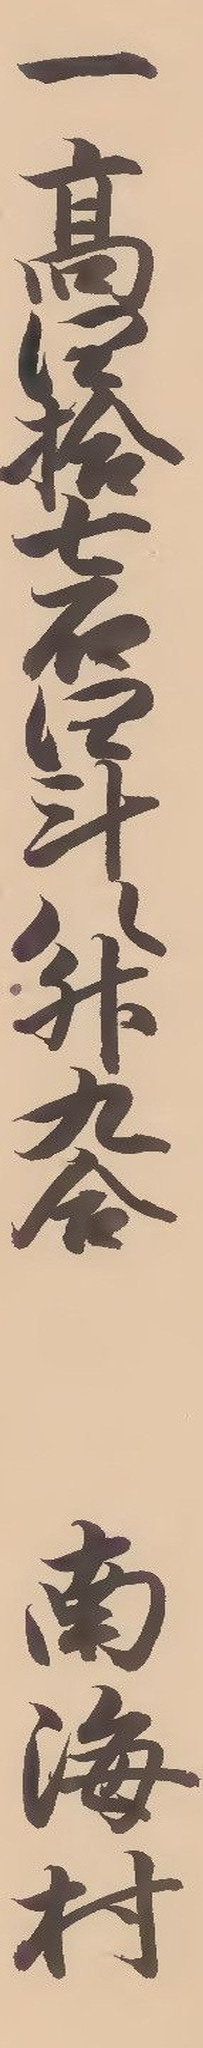一高四拾七石四斗八升九合南海村

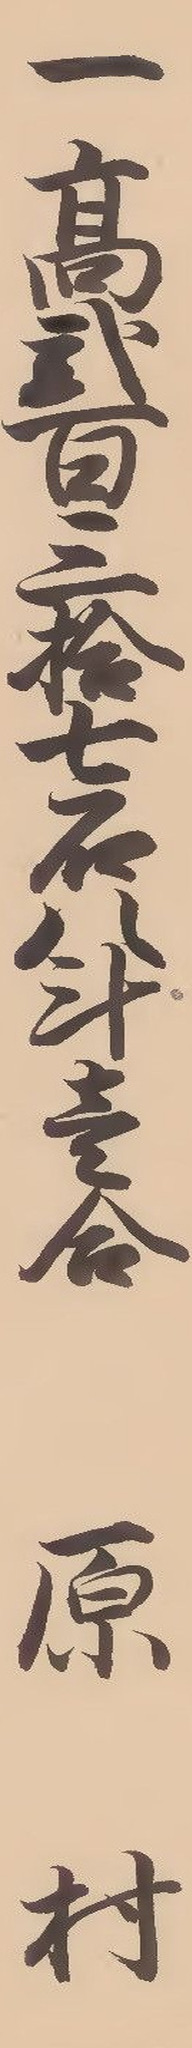一高弐百三拾七石八斗壱合原村
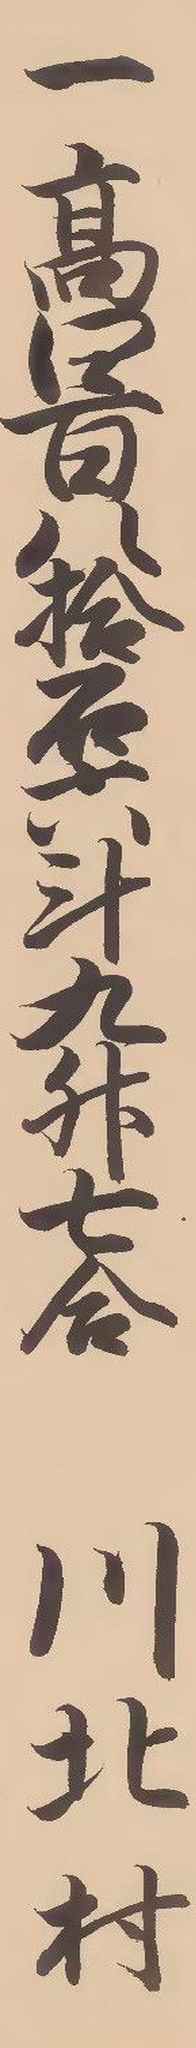一高四百八拾石六斗九升七合川北村
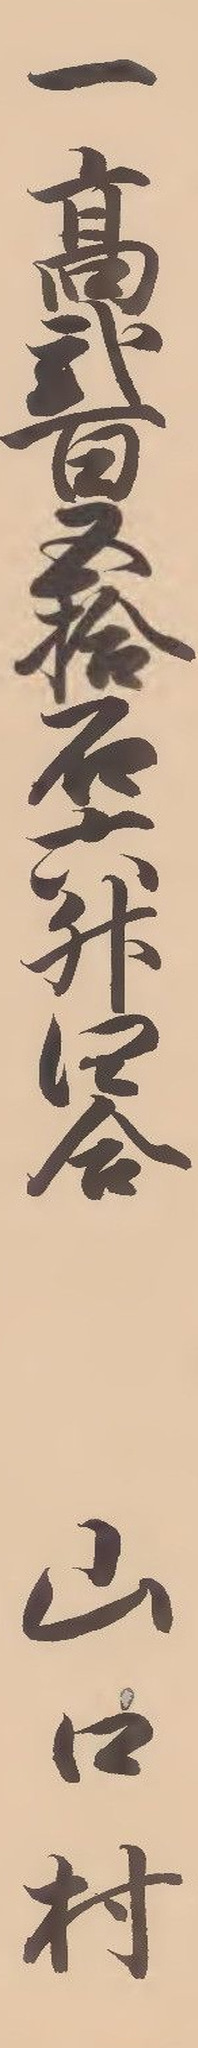一高弐百五拾石六升四合山口村
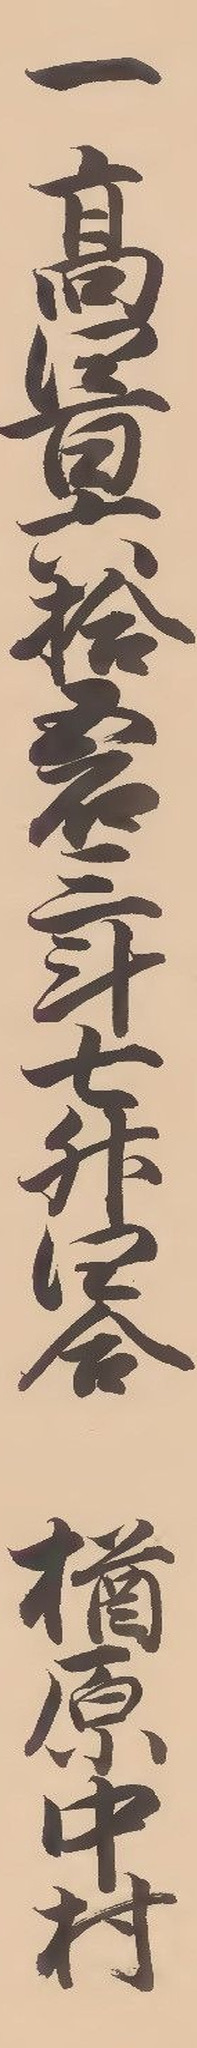一高四百六拾五石三斗七升四合楢原中村
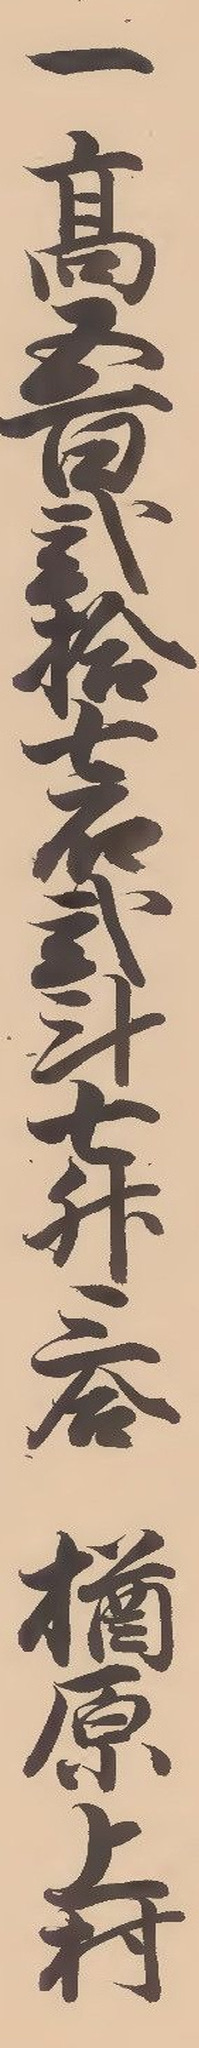一高五百弐拾七石弐斗七升三合楢原上村
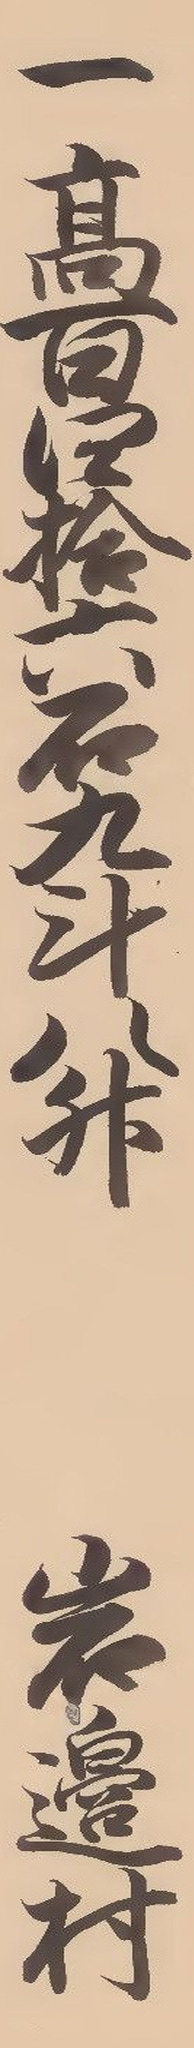一高百四拾六石九斗八升岩辺村
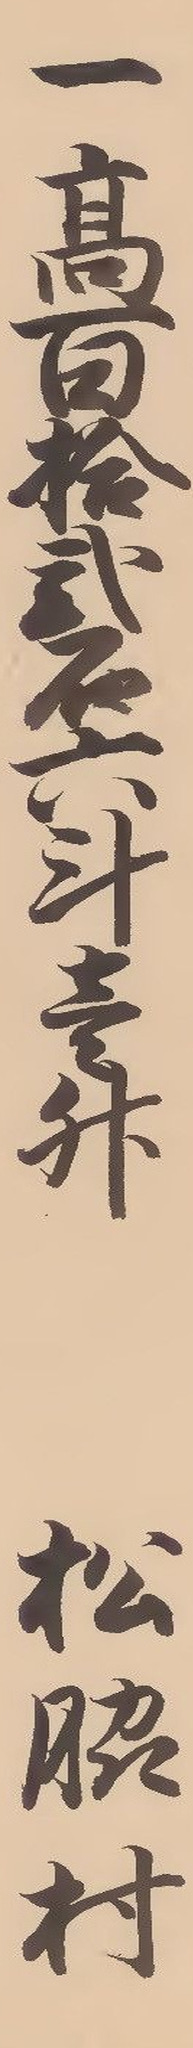一高百拾弐石六斗壱升松脇村
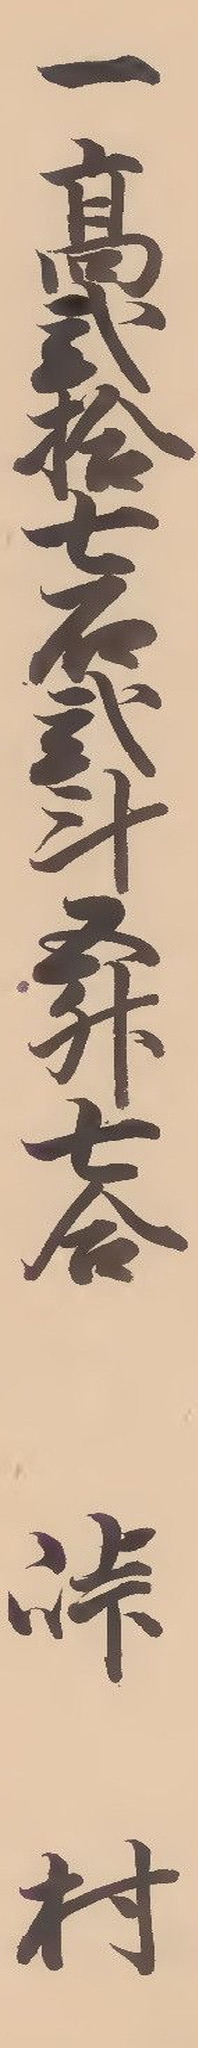一高弐拾七石弐斗五升七合峠村

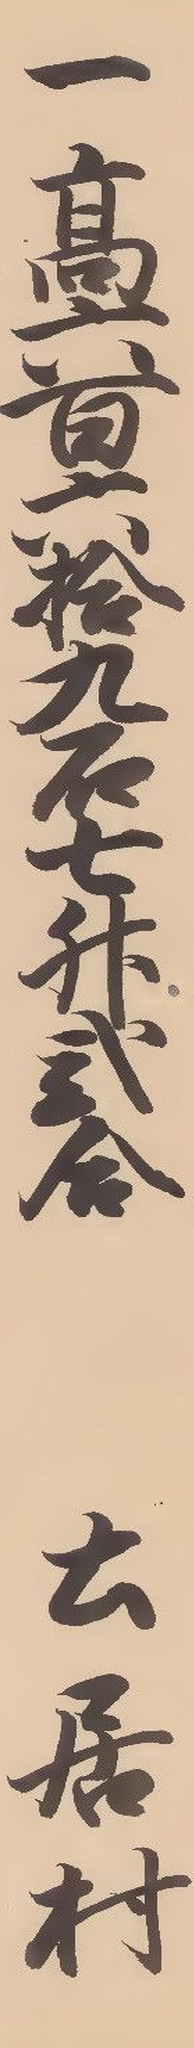一高六百六拾九石七升弐合土居村
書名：美作国郷帳
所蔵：国立公文書館 National Archives of Japan
